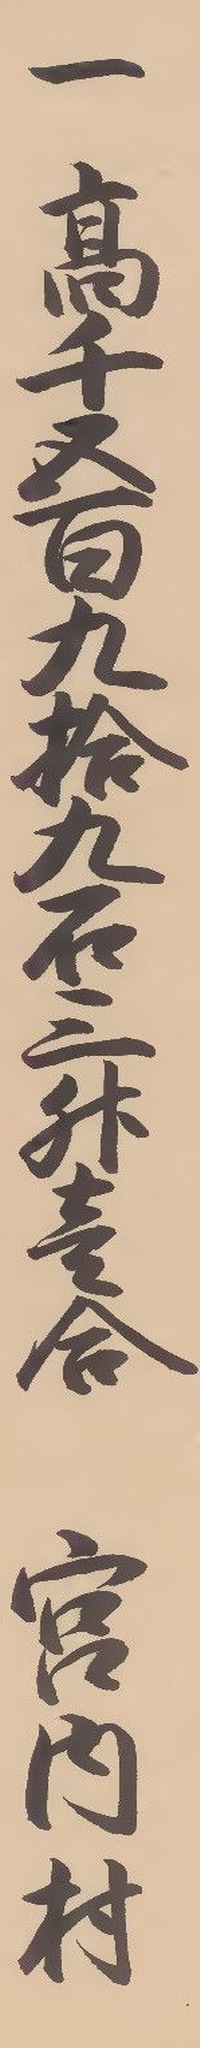一高千五百九拾九石三升壱合宮内村

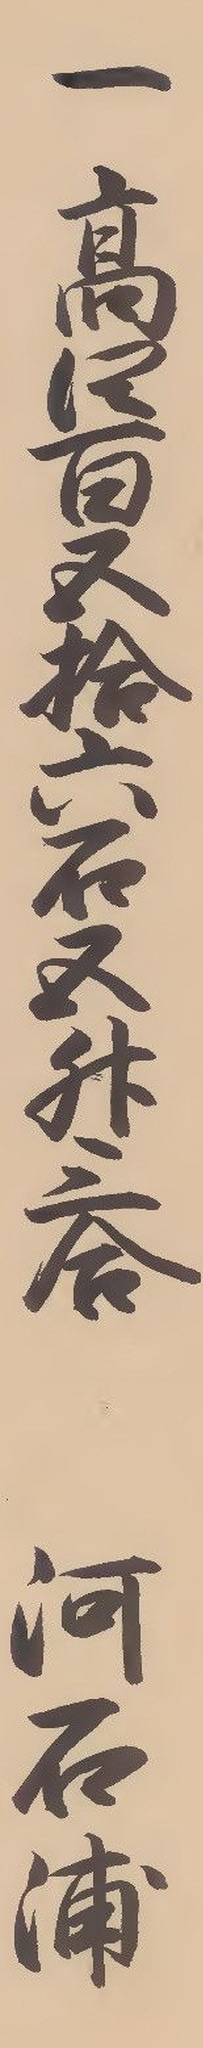一高四百五拾六石五升三合河石浦
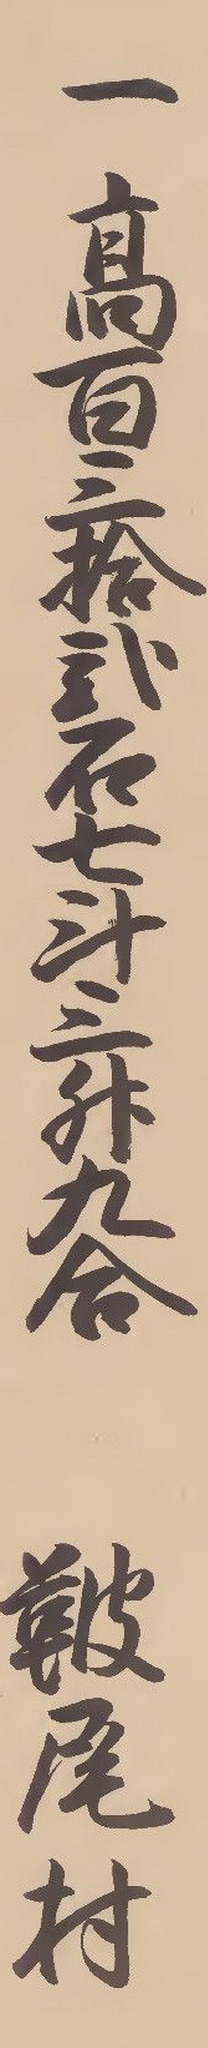一高百三拾弐石七斗三升九合皷尾村
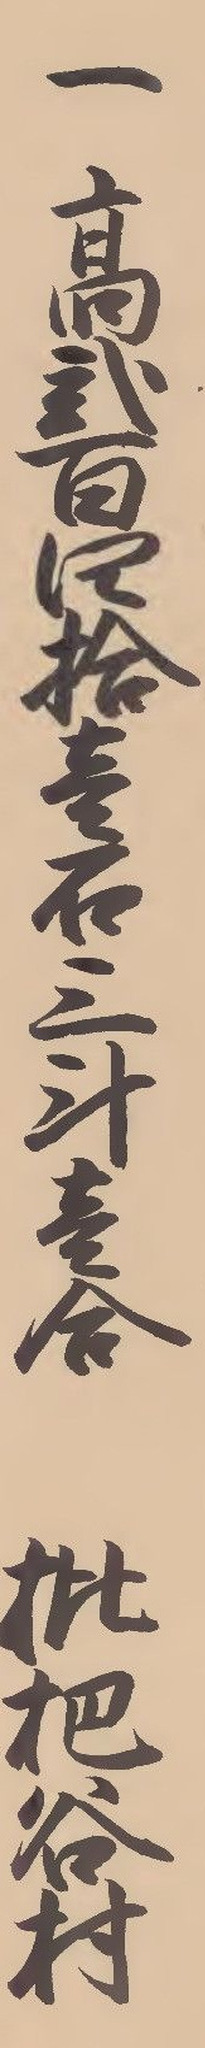一高弐百四拾壱石三斗壱合批杷谷村
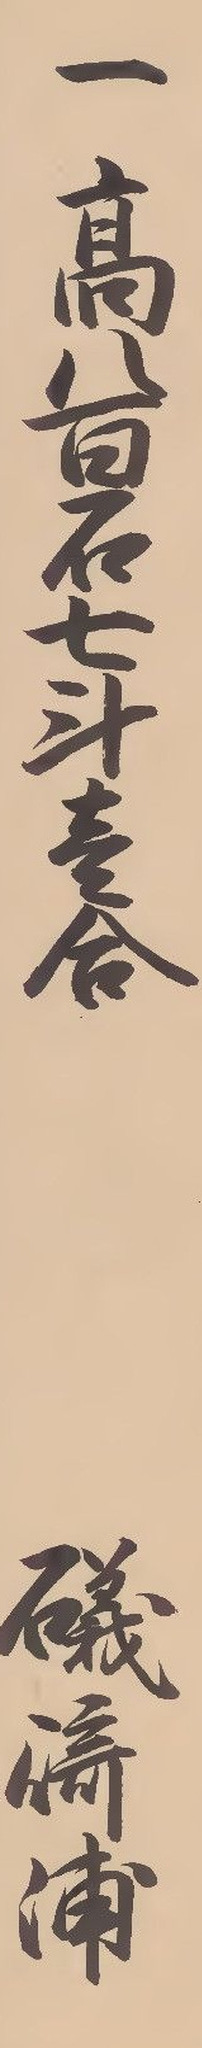一高八百石七斗壱合磯崎浦
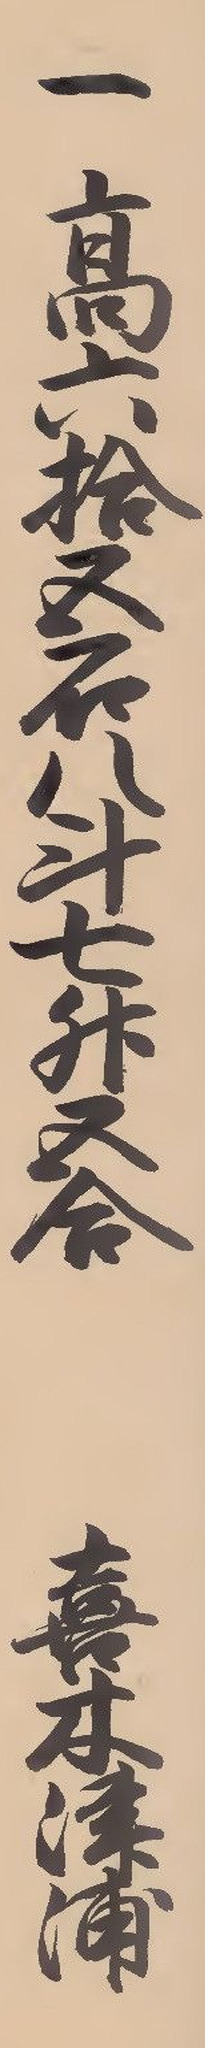一高六拾五石八斗七升五合喜木津浦
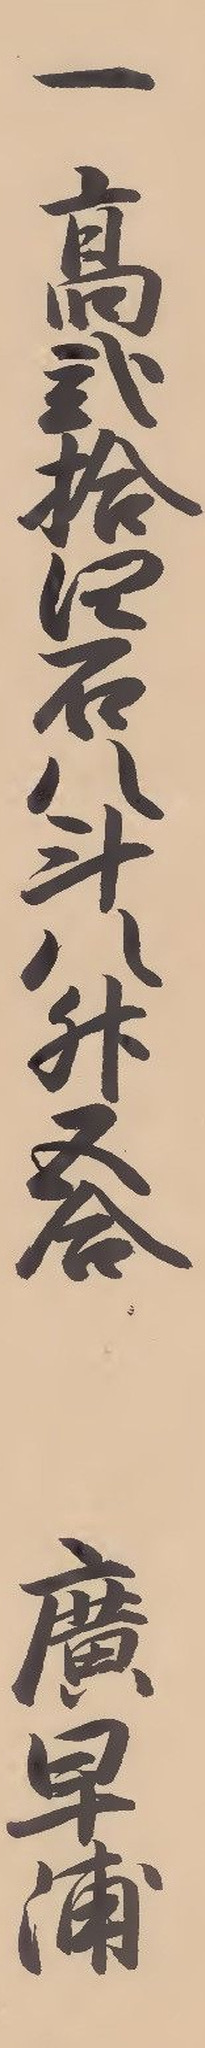一高弐拾四石八斗八升五合広早浦
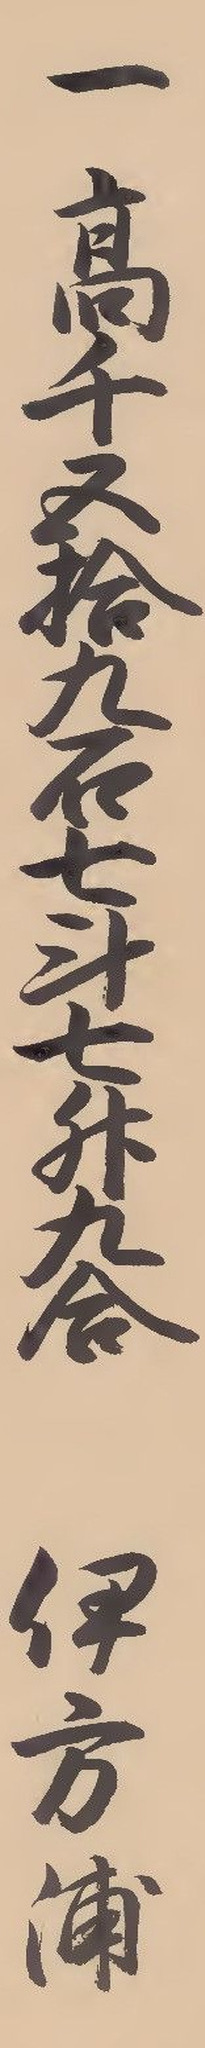一高千五拾九石七斗七升九合伊方浦
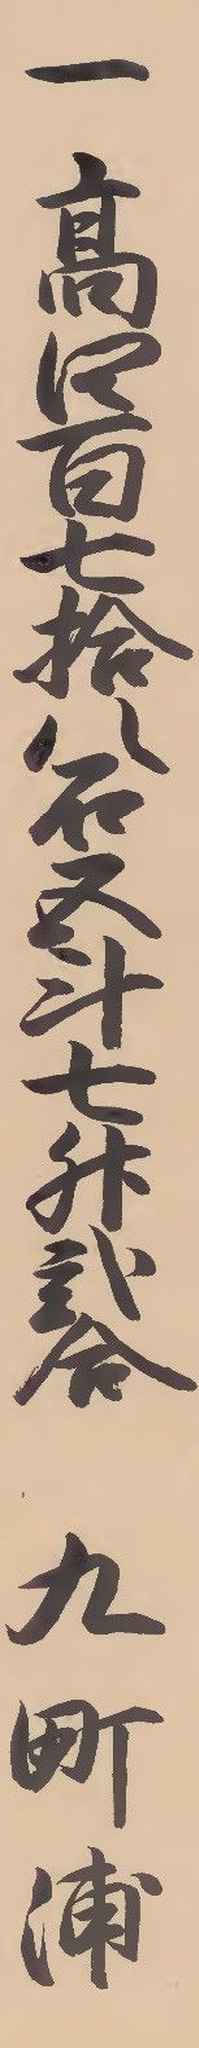一高四百七拾八石五斗七升弐合九町浦

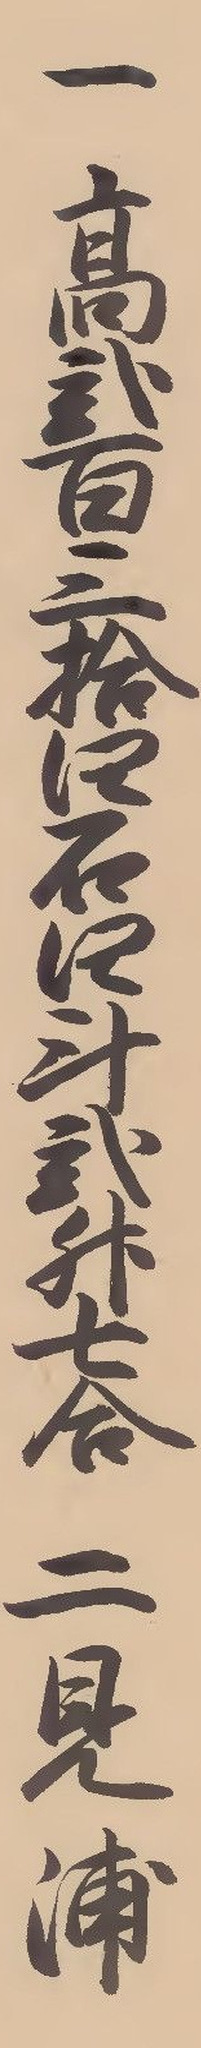一高弐百三拾四石四斗弐升七合二見浦
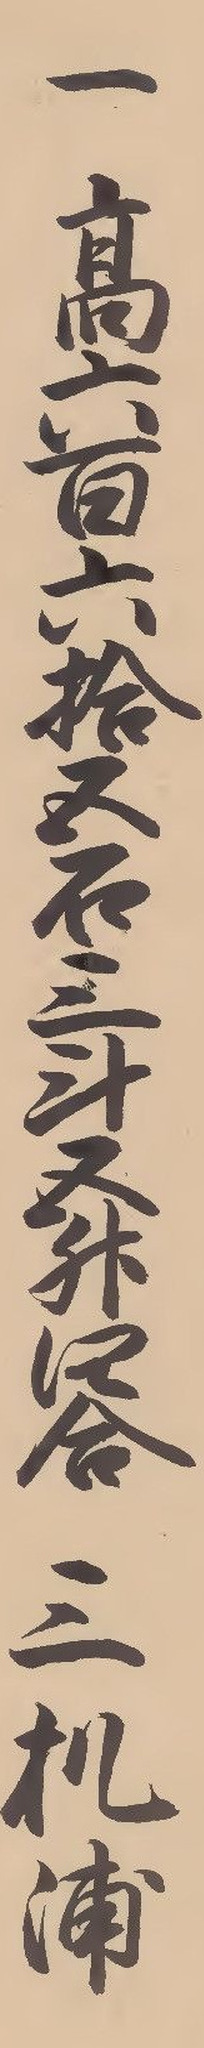一高六百六拾五石三斗五升四合三机浦
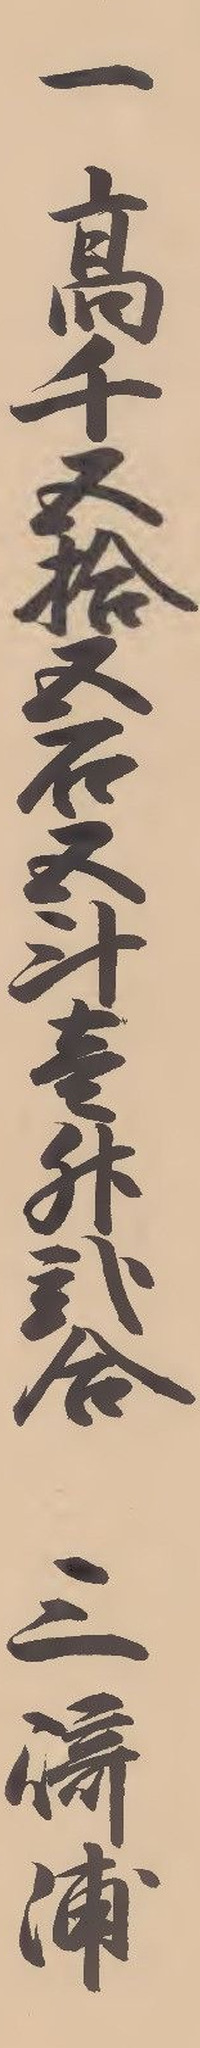一高千五拾五石五斗壱升弐合三崎浦
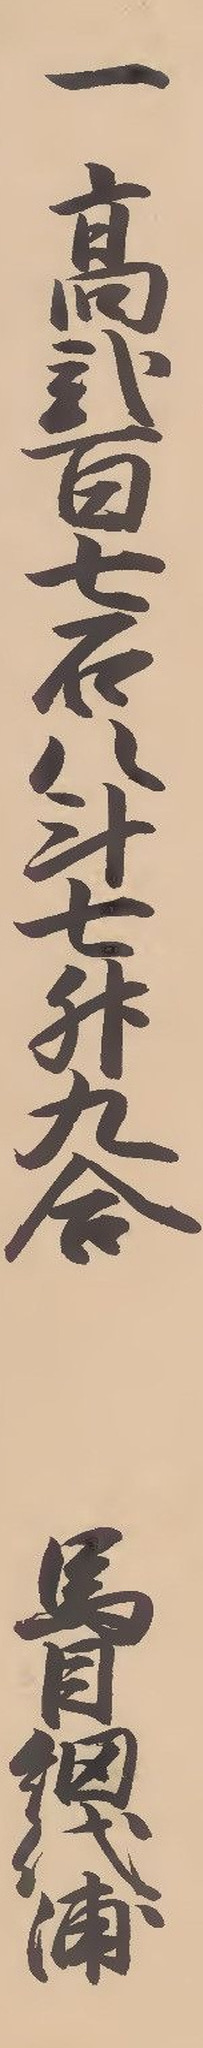一高弐百七石八斗七升九合馬目網代浦
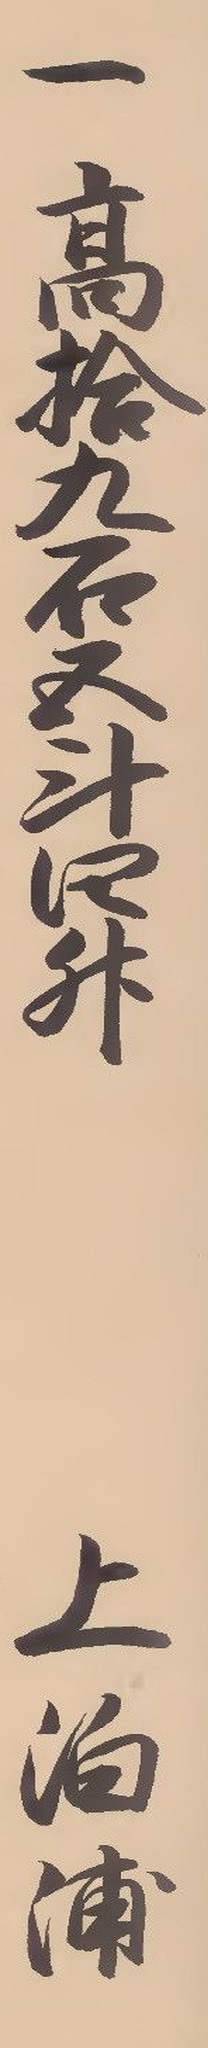一高拾九石五斗四升上泊浦
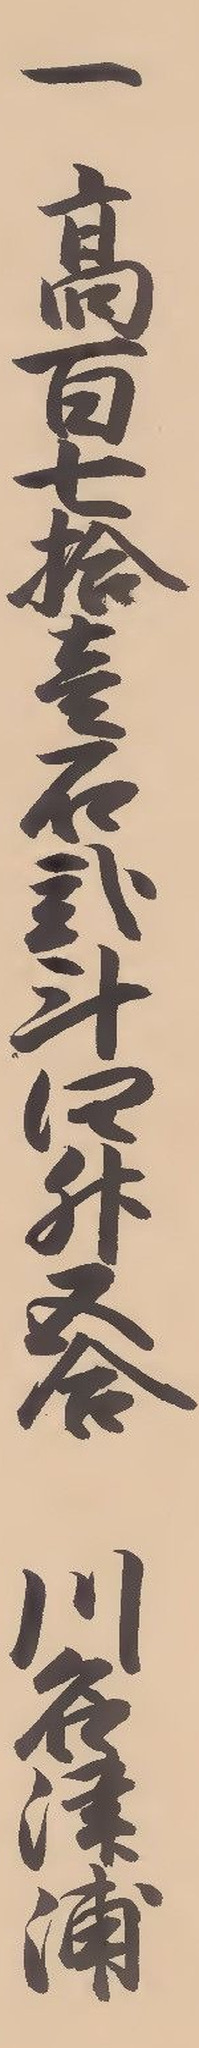一高百七拾壱石弐斗四升五合川名津浦
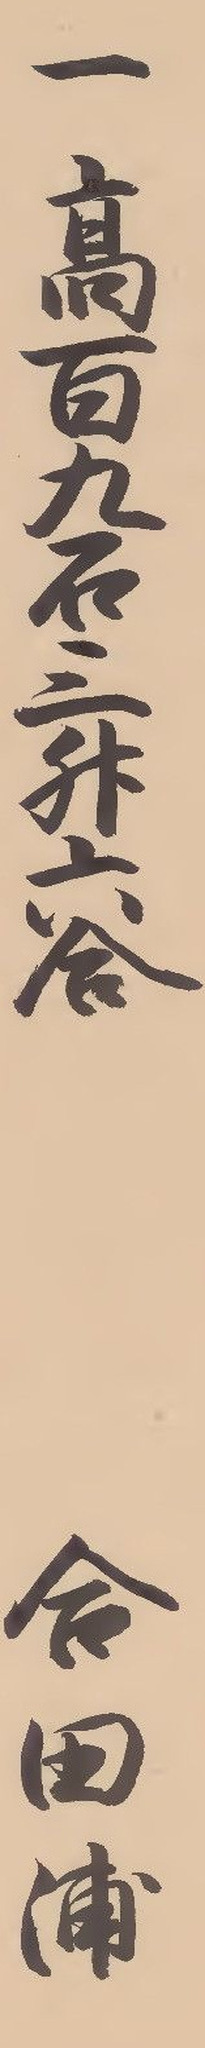一高百九石三升六合合田浦
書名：伊予国郷帳
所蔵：国立公文書館 National Archives of Japan
